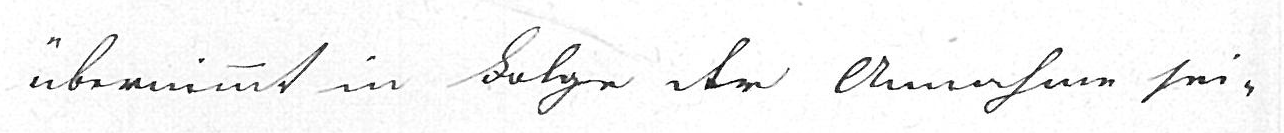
übernimmt in Folge der Annahme sei-
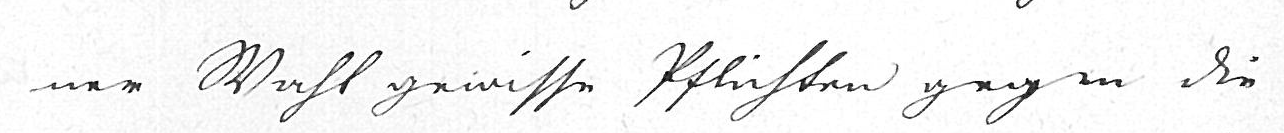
ner Wahl gewisse Pflichten gegen die
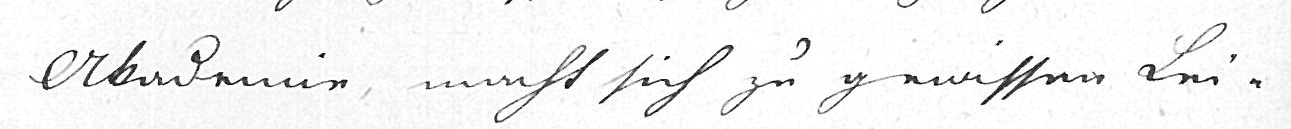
Akademie, macht sich zu gewissen Lei-
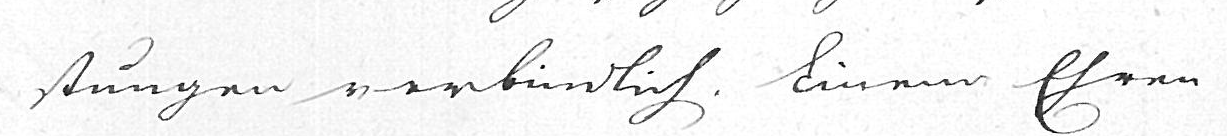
stungen verbindlich. Einem Ehren-
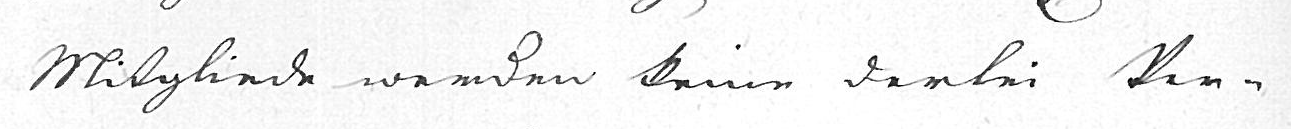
Mitgliede werden keine derlei Ver-
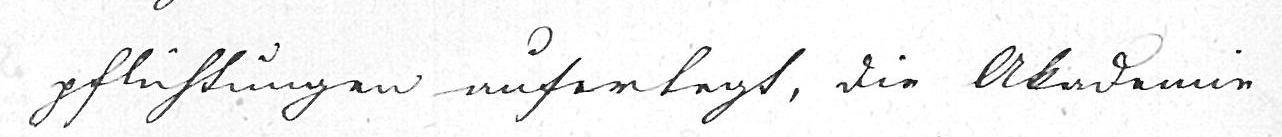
Pflichtungn auferlegt, die Akademie
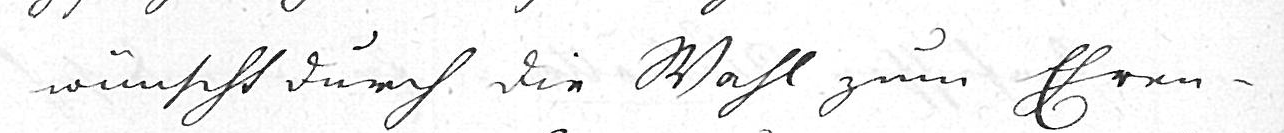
wünscht durch die Wahl zum Ehren-
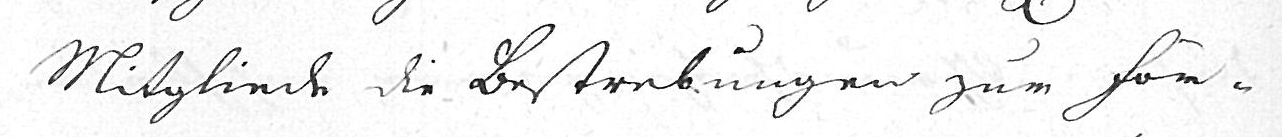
Mitgliede die Bestrebungen zur För-
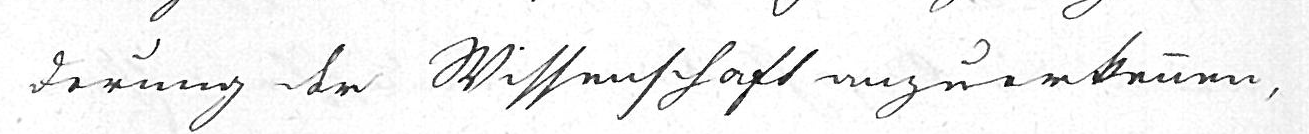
derung der Wissenschaften anzuerkennen,
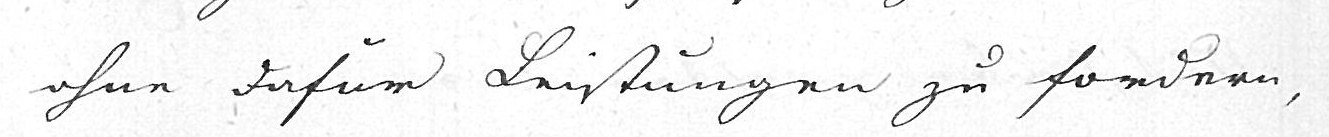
ohne dafür Leistungen zu fordern,
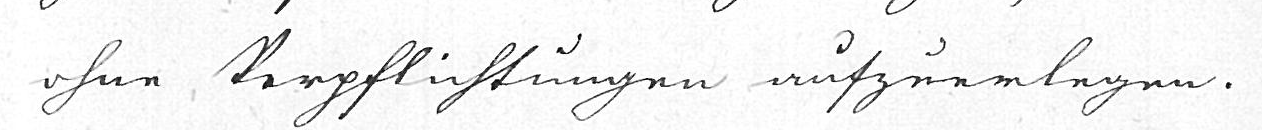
ohne Verpflichtungen aufzuerlegen.
